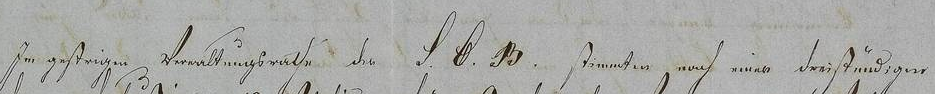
Im gestrigen Verwaltungsrathe der S.C.B. stimmten nach einer dreistündigen
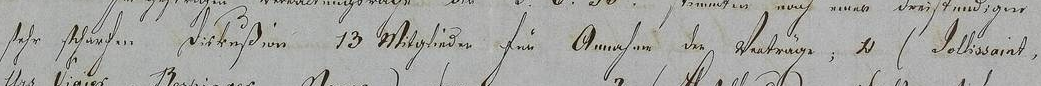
sehr scharfen Diskußion 13 Mitglieder für Annahme der Verträge; 4 (Jollissaint,
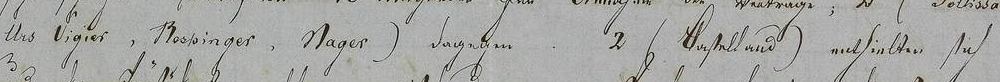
Urs Vigier, Respinger, Nager) dagegen. 2 (Baselland) enthielten sich
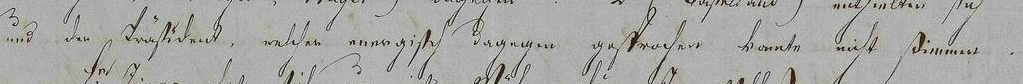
und der Präsident, welcher energisch dagegen gesprochen konnte nicht stimmen.
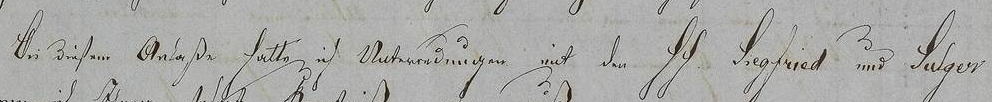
Bei diesem Anlaße hatte ich Unterredungen mit den HH. Siegfried und Sulger
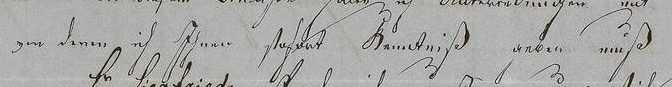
von denen ich Ihnen sofort Kenntniß geben muß.
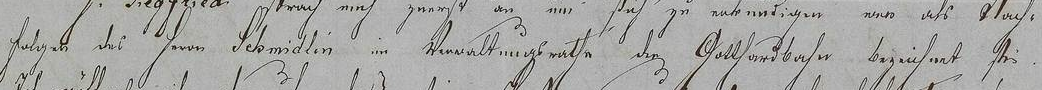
folger des Herrn Schmidlin im Verwaltungsrathe der Gotthardbahn bezeichnet sei.
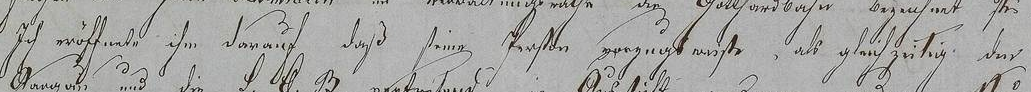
Ich eröffnete ihm darauf daß seine Person vorzugsweise als gleichzeitig den
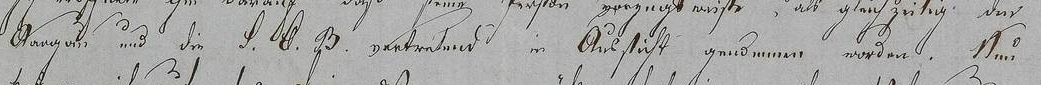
Aargau und die S.C.B. vertretend in Aussicht genommen worden. Nun
